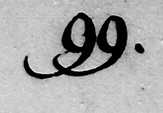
65.
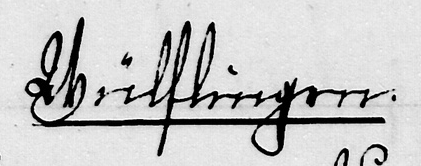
Wülflingen.
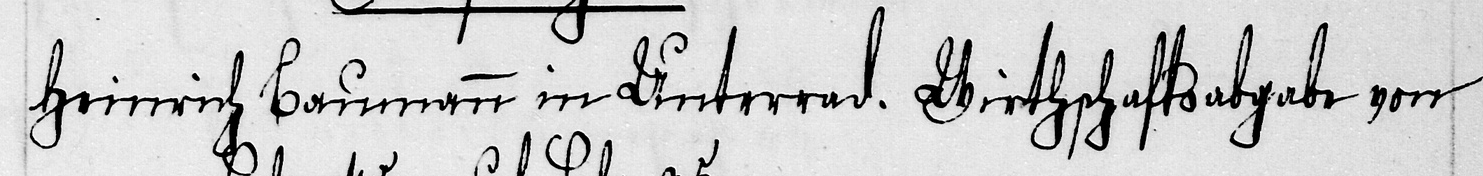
Heinrich Baumann in Unterrad. Wirthschaftsabgabe von
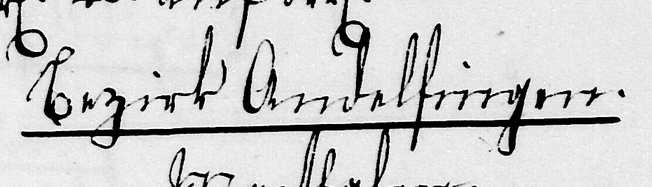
Bezirk Andelfingen.
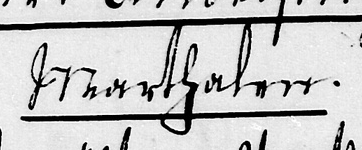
Marthalen.
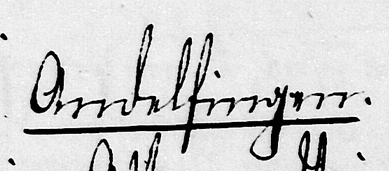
Andelfingen.
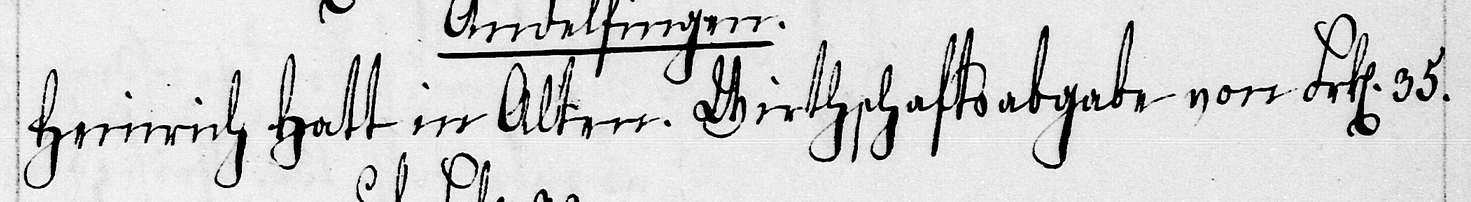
Heinrich Hatt in Alten. Wirthschaftsabgabe von Frk[en].
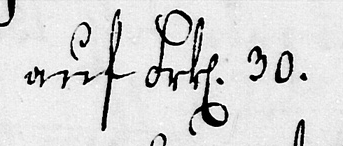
auf Frk[en].
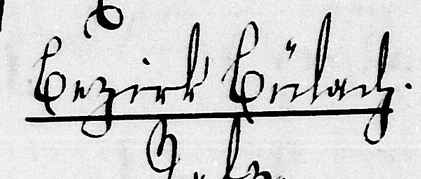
weil wegen
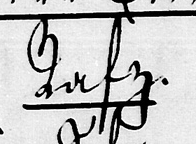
Rafz.
